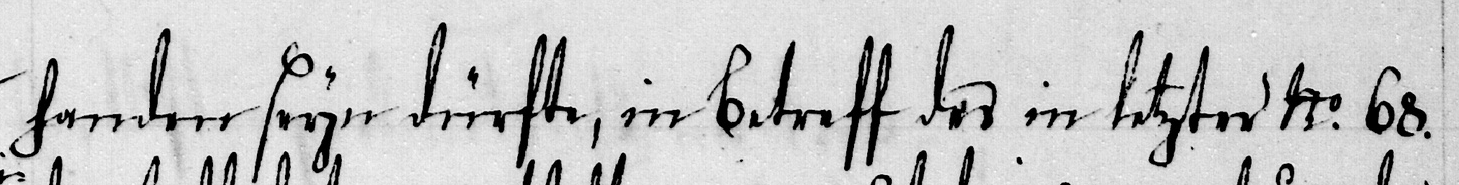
handen seyn dürfte, in Betreff des in letzter No. 68.
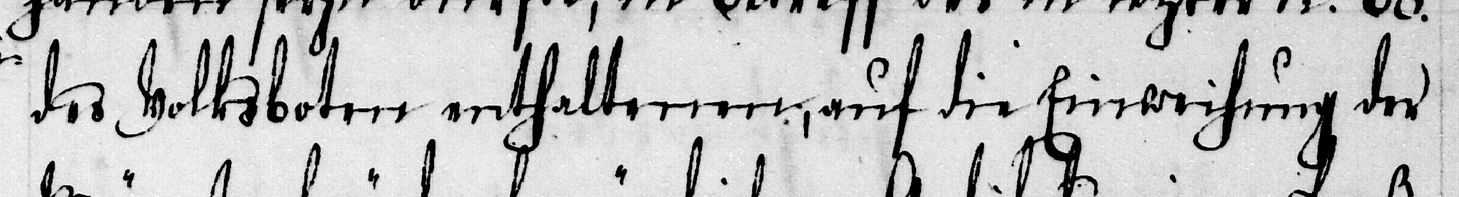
des Volksboten enthaltenen, auf die Einweihung der
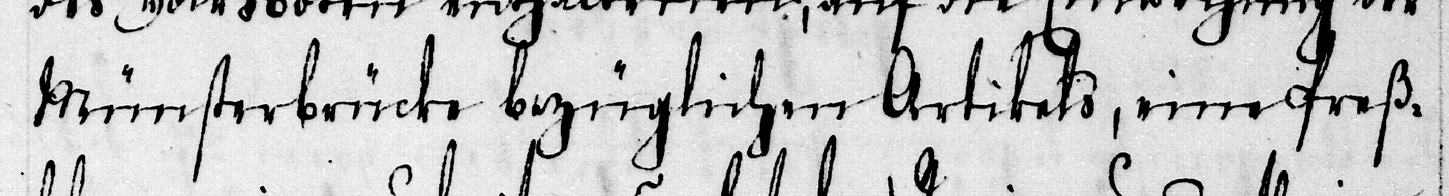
Münsterbrücke bezüglichen Artikels, eine Preß¬
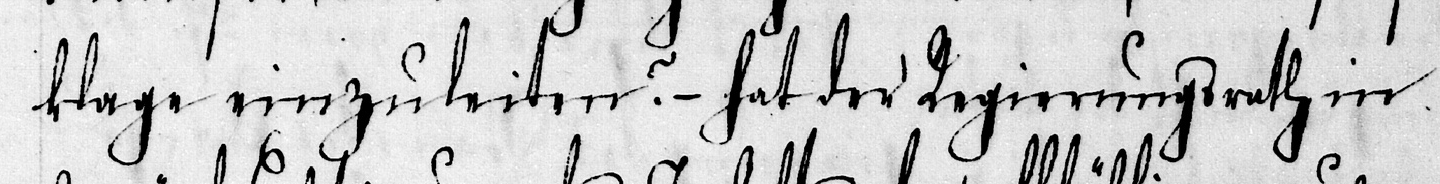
klage einzuleiten? – hat der Regierungsrath in
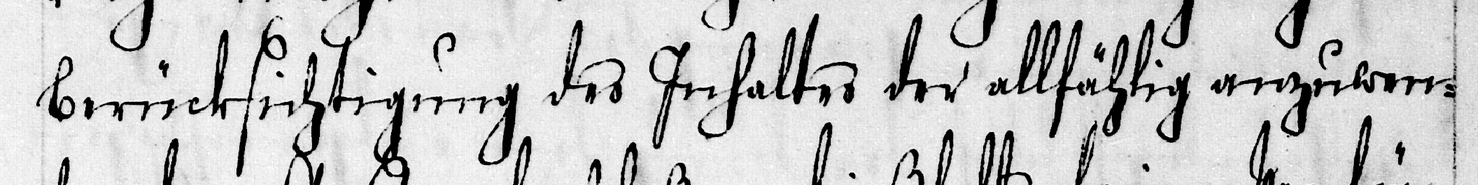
Berücksichtigung des Inhaltes der allfählig anzuwen¬
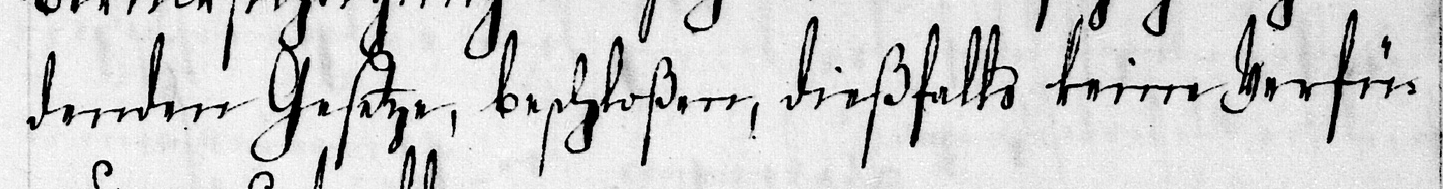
denden Gesetze, beschloßen, dießfalls keine Verfü¬
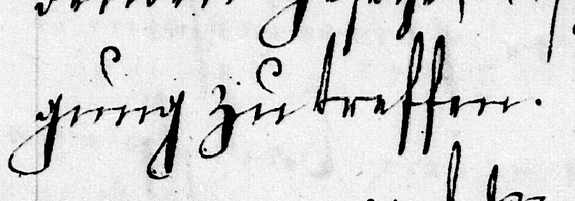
gung zu treffen.
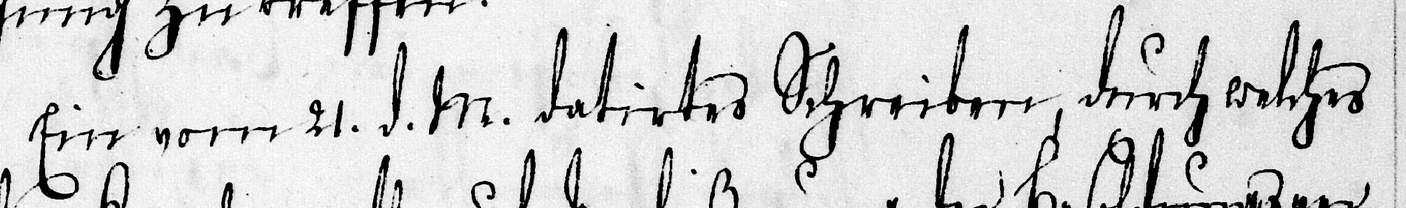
Ein vom 21. d. M. datirtes Schreiben, durch welches
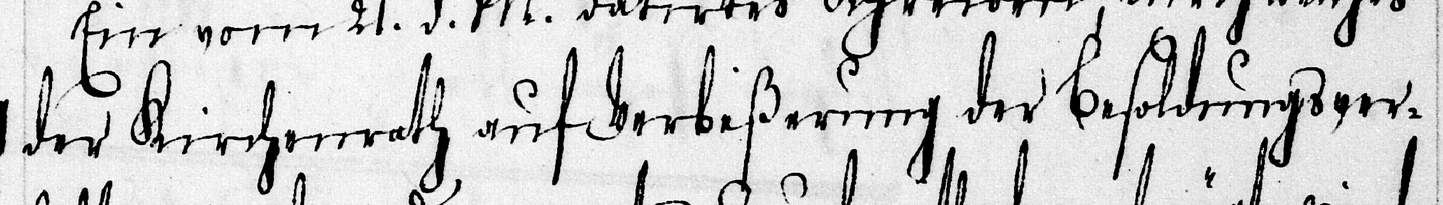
der Kirchenrath auf Verbeßerung der Besoldungsver¬
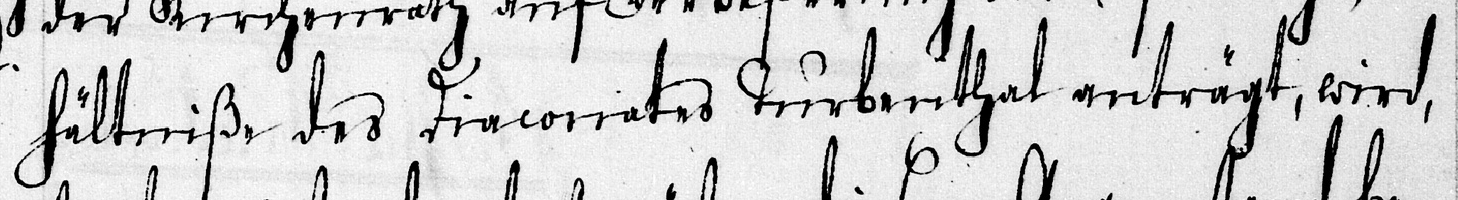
hältniße des Diaconates Turbenthal anträgt, wird,
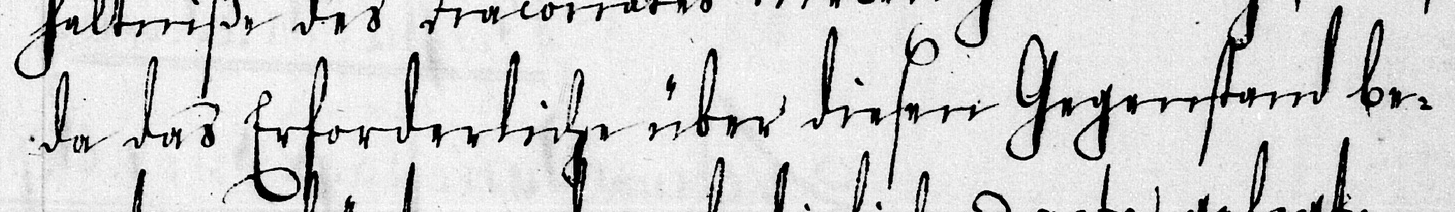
da das Erforderliche über diesen Gegenstand be¬
